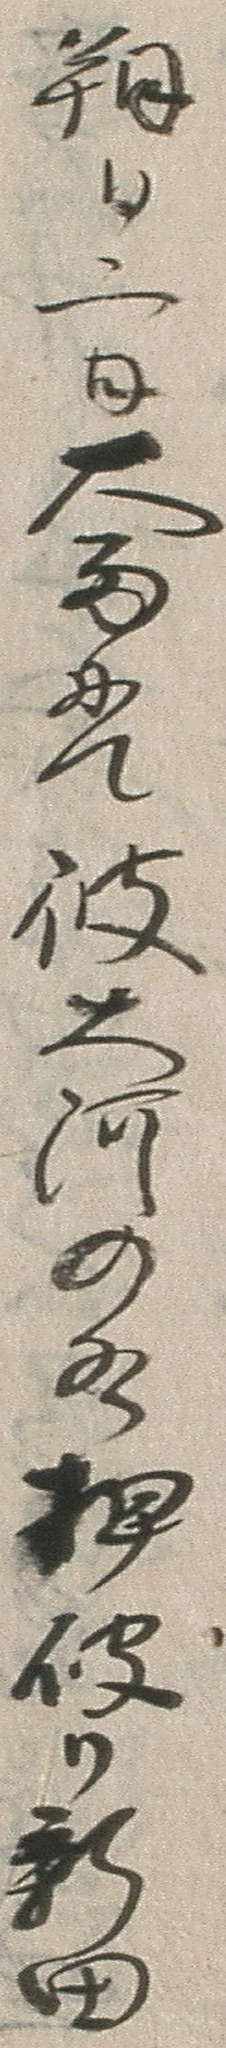朔日二日大雨にて彼大河の水押破り新田
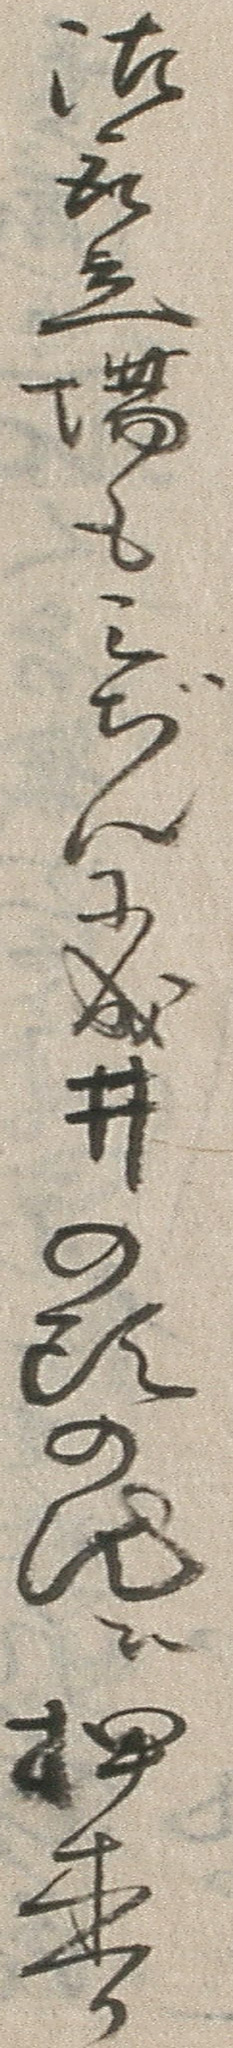御取立場もみぢんに成井の頭の池え押来り
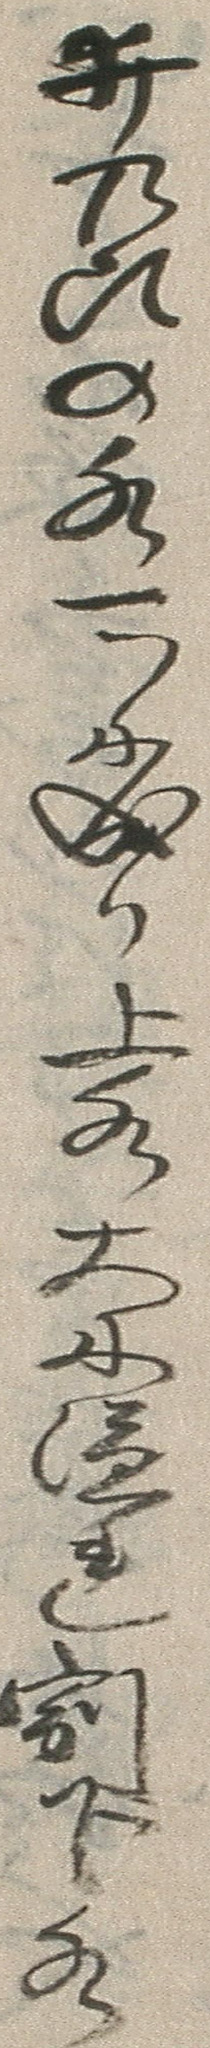井の頭の水一ツに成り上水大に溢れ割下水
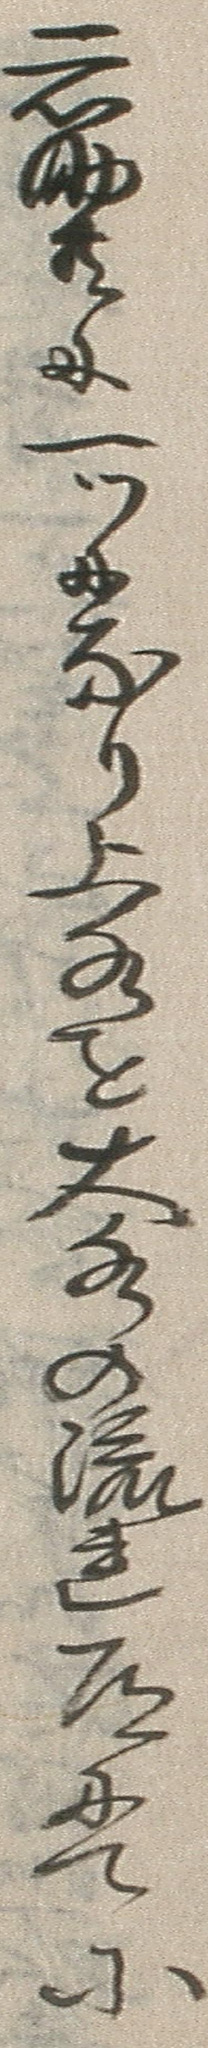二筋共に一ツになり上水を大水の流れ道にて小
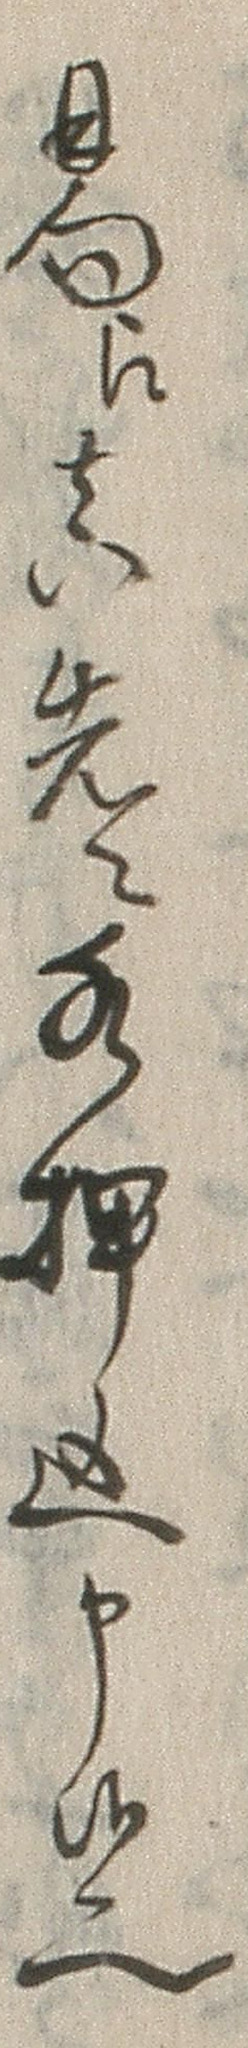日向え真先に水押込申候也
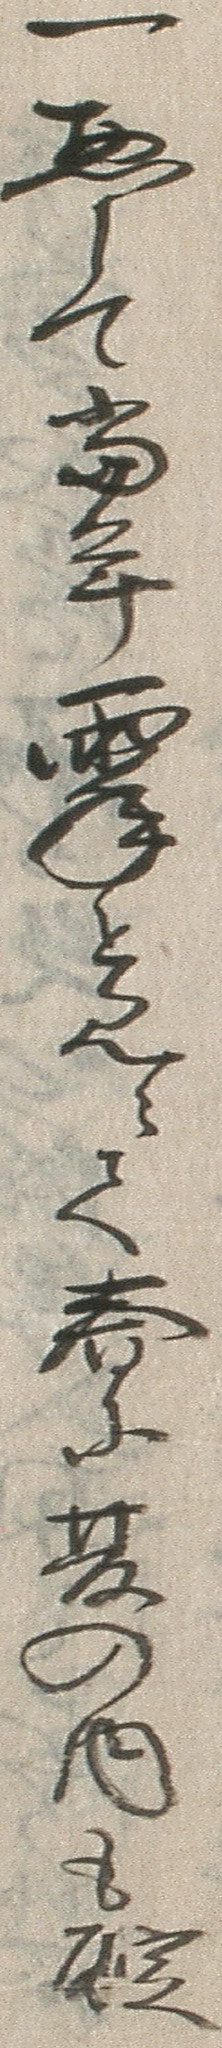一惣して当年雨年と見えて春に夏の内も聢
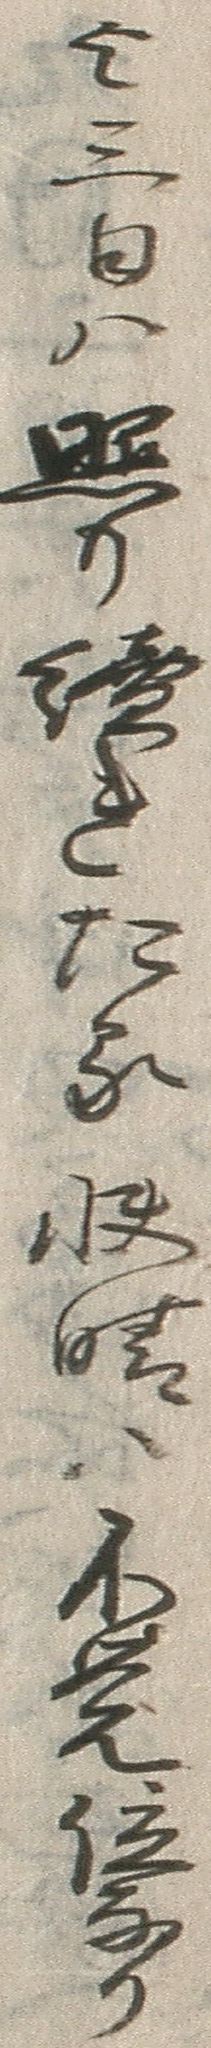と三日は照り続きたる快晴は不覚位なり
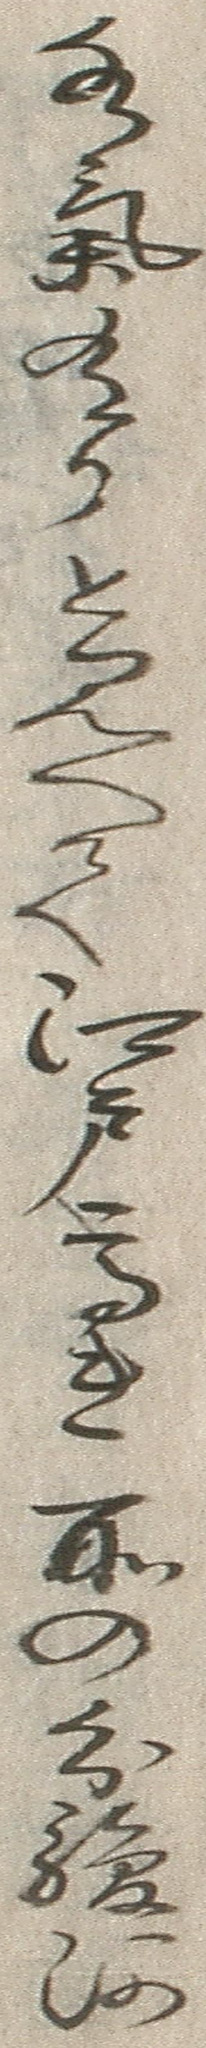水気有りと見へて江戸高き所の分駿河
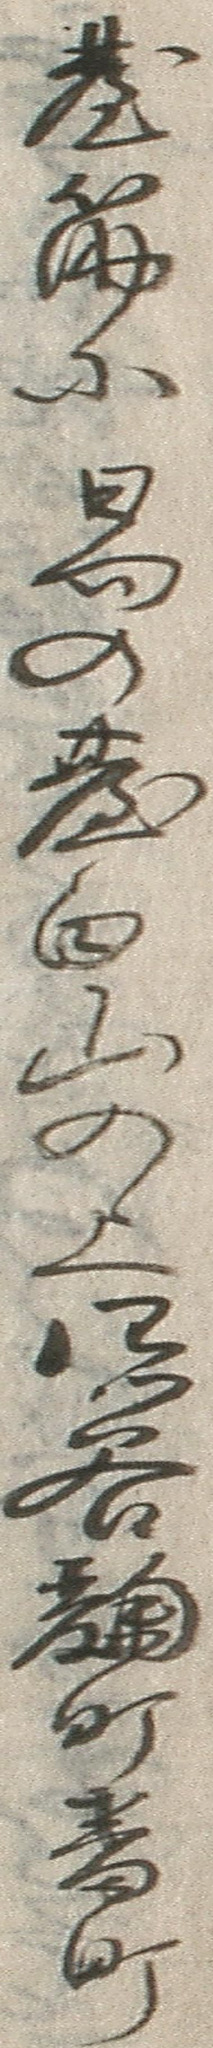台筋小日向の台白山の上四ツ谷麹町番町
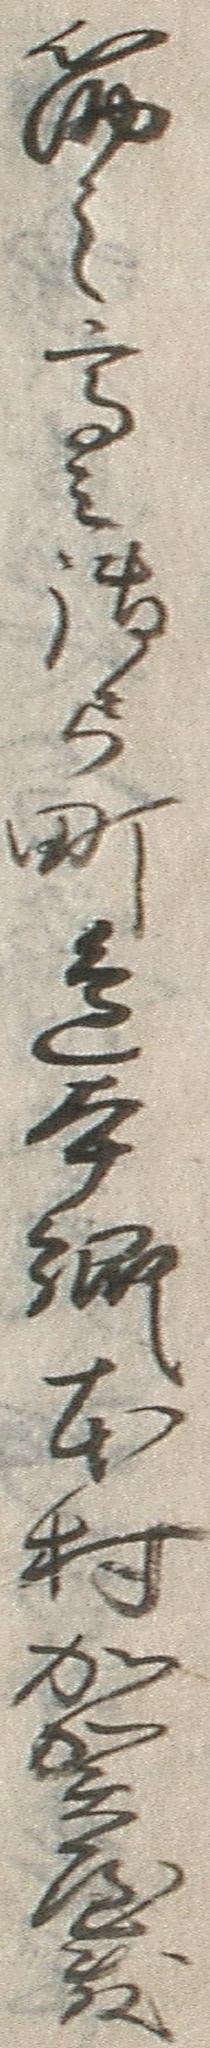筋之高み御弓町辺本郷本村加賀屋敷
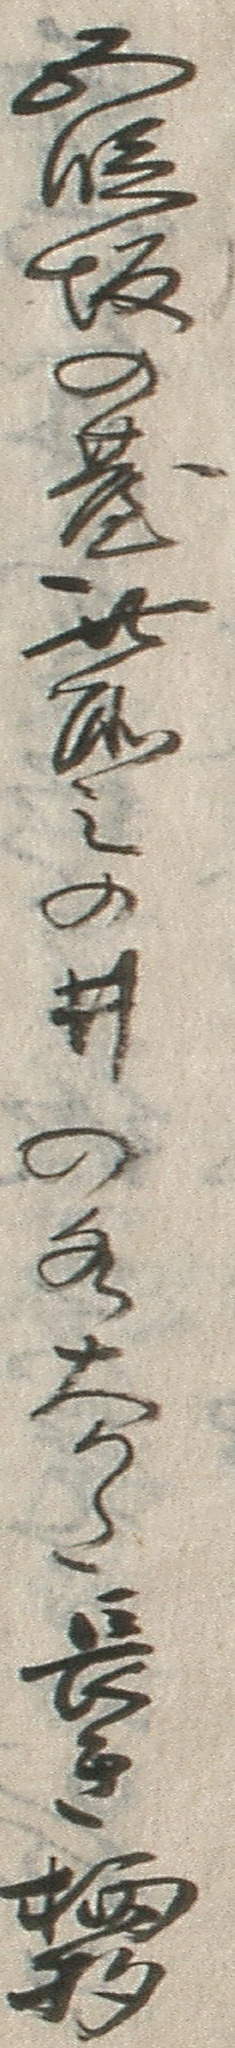五段坂の台此所の井の水大かた長き柄杓
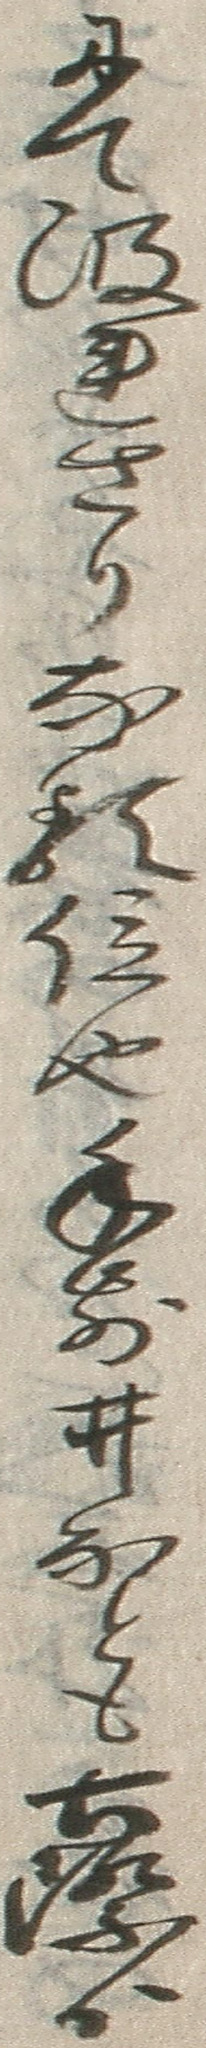にて汲れさりなる位也手前井なとも土際ゟ

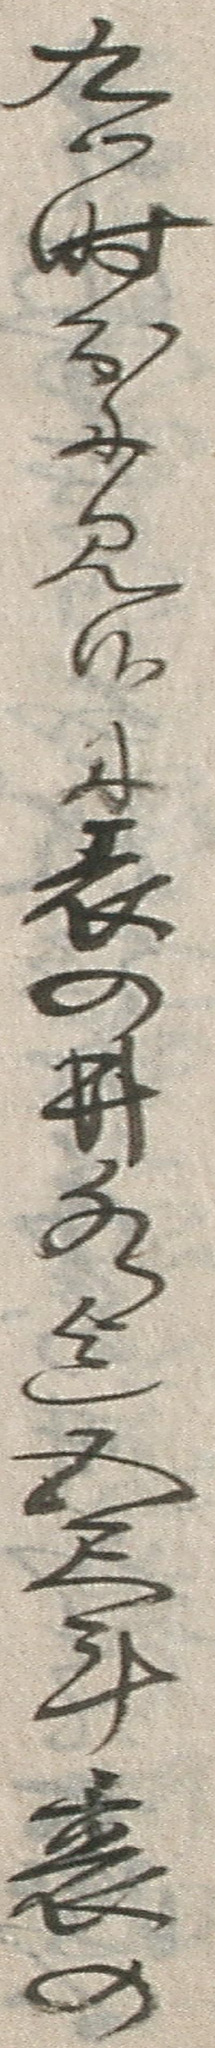九ツ時分に見候に表の井水迄五尺計裏の
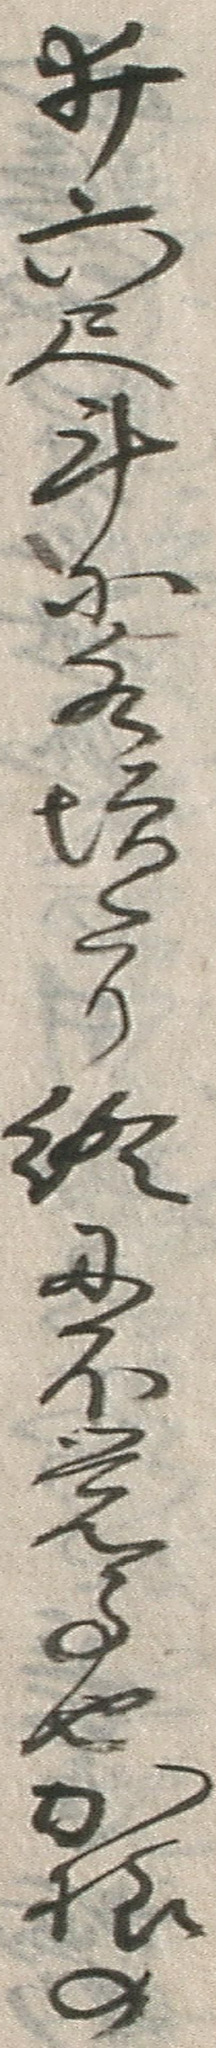井六尺計に水増たり終に不覚事也か様の
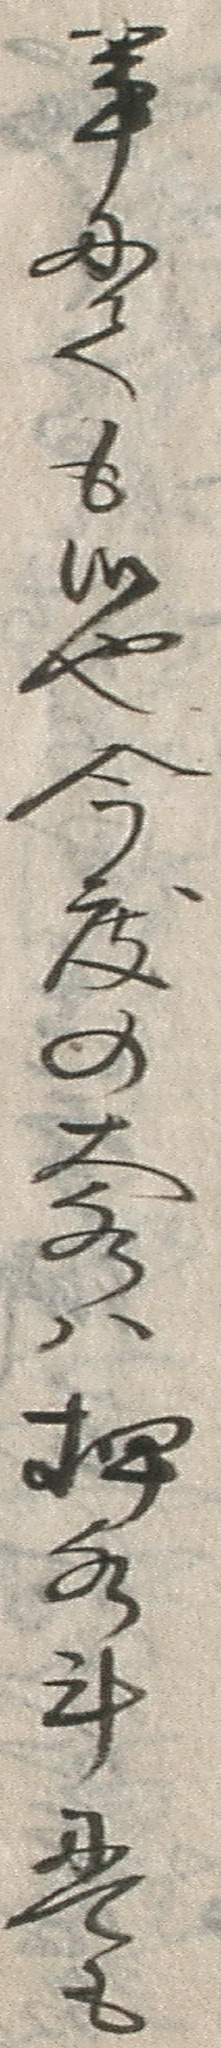事にても候也今度の大水は押水計にても
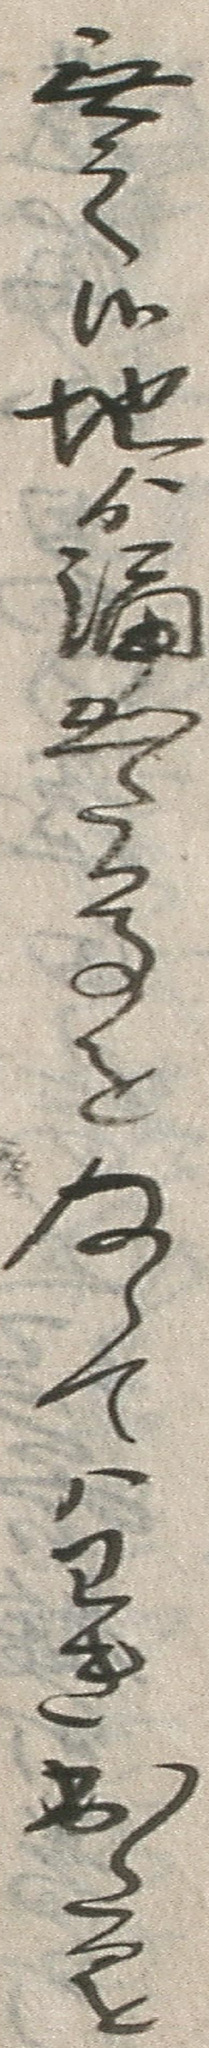無之候地ゟ涌出たることを何してはわき出たると
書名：享保十三年江戸洪水記
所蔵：東京大学地震研究所図書室 Earthquake Research Institute Library, The University of Tokyo, JAPAN
